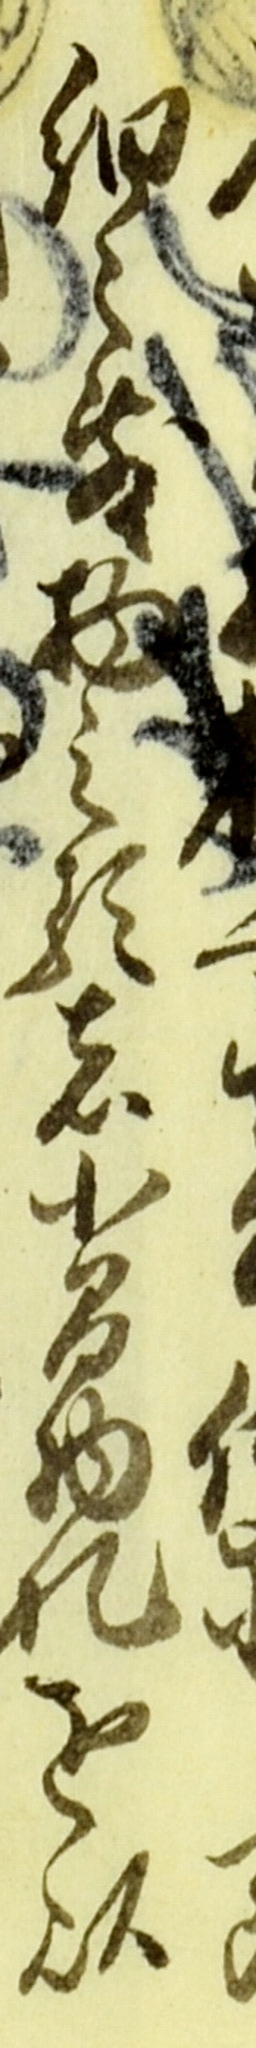細々敷物之類物小間物札を以
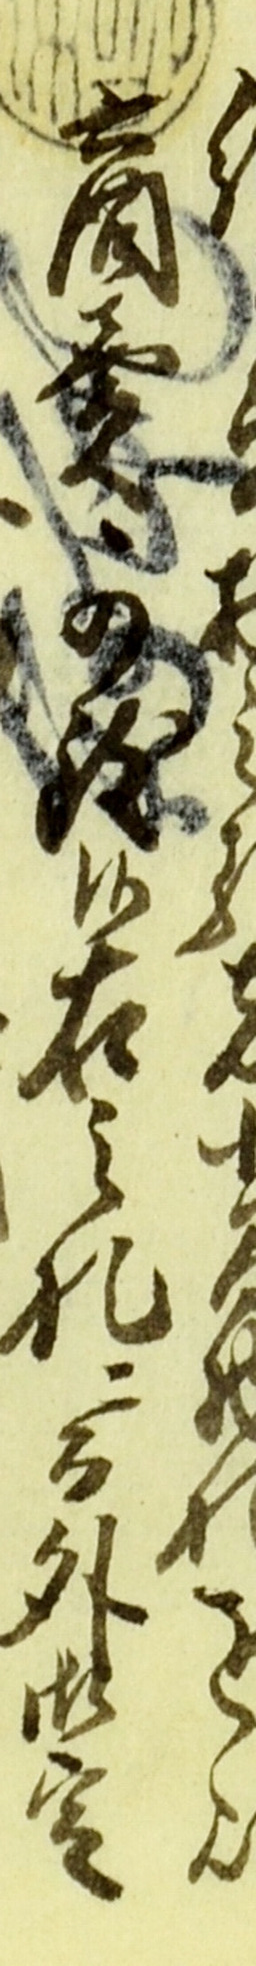商売可致候右之札ニ而外御定
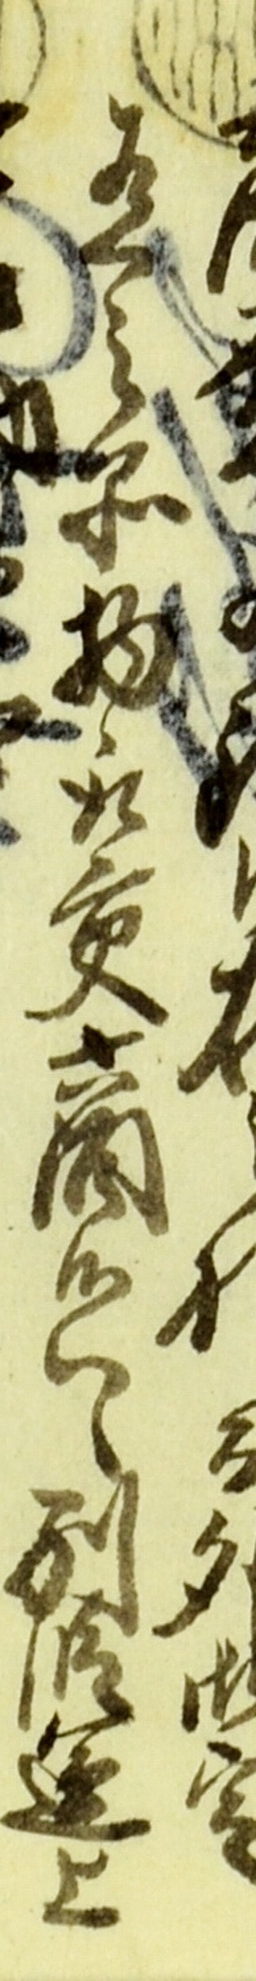有之品物取受商候ハゝ別段運上
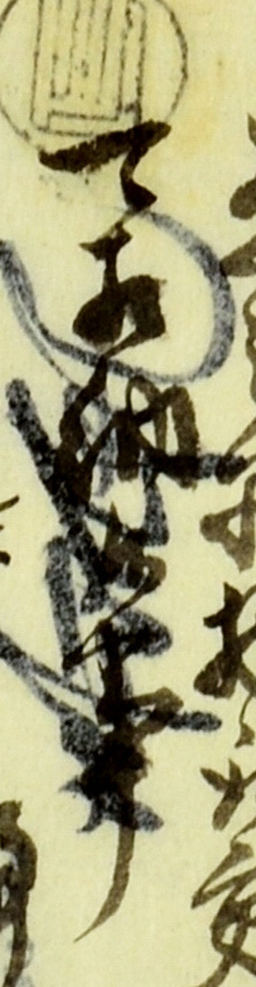可相納候事
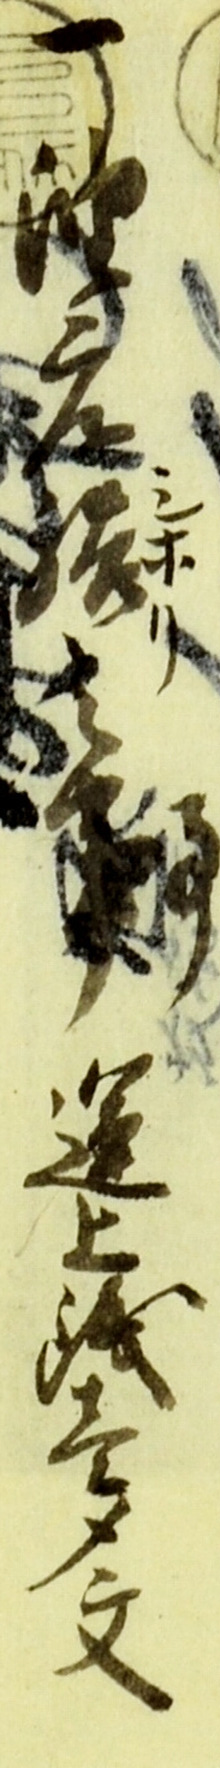一油元絞之事運上銭壱貫文
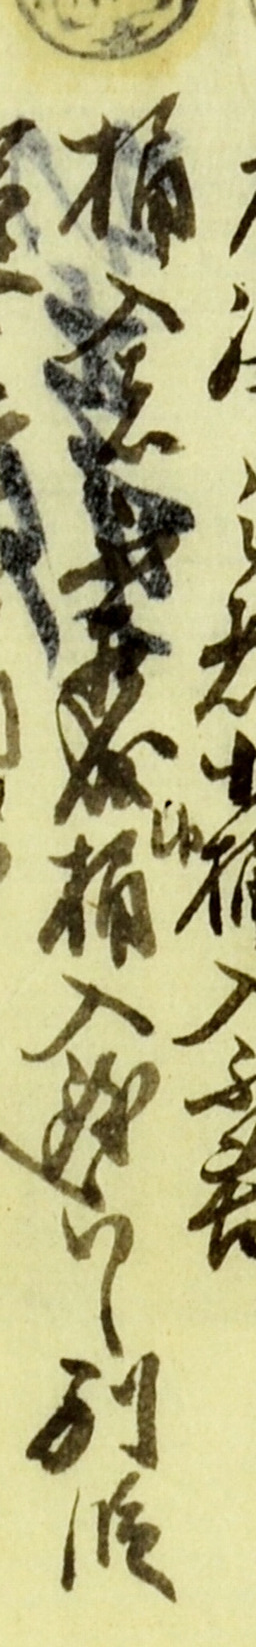桶入物不相成候桶入致候ハゝ別段
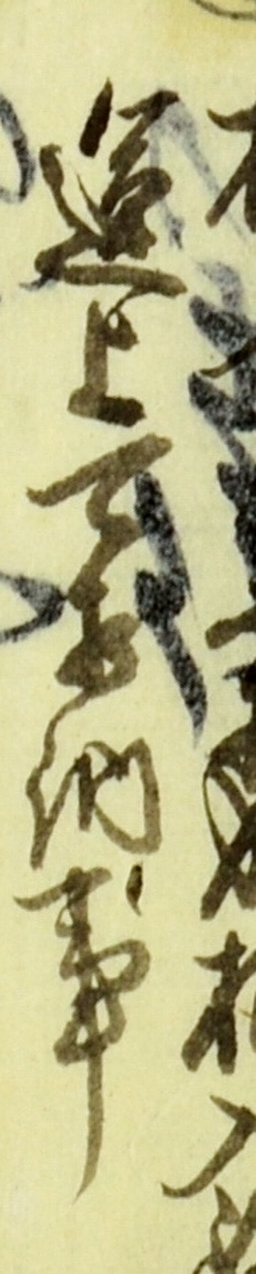運上可相納事
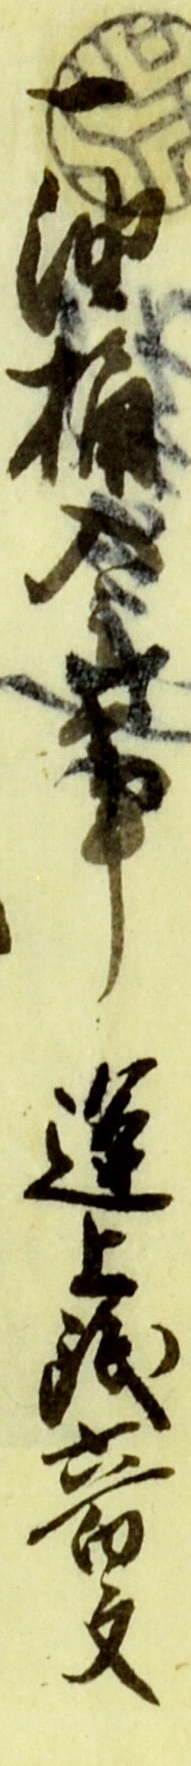一油桶入之事運上銭六百文
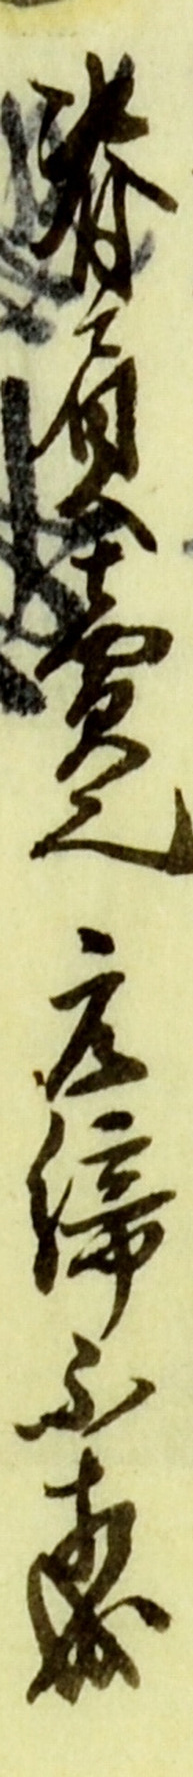背負売也元締不相成
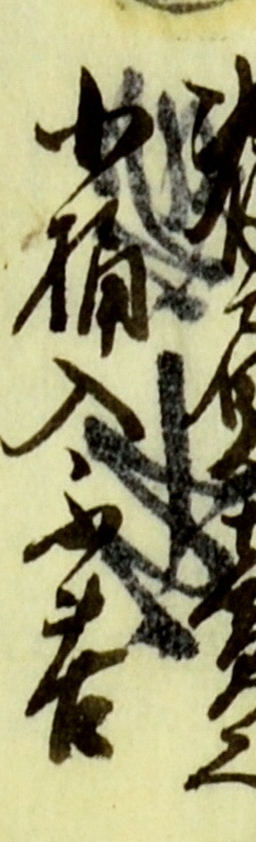小桶入不苦

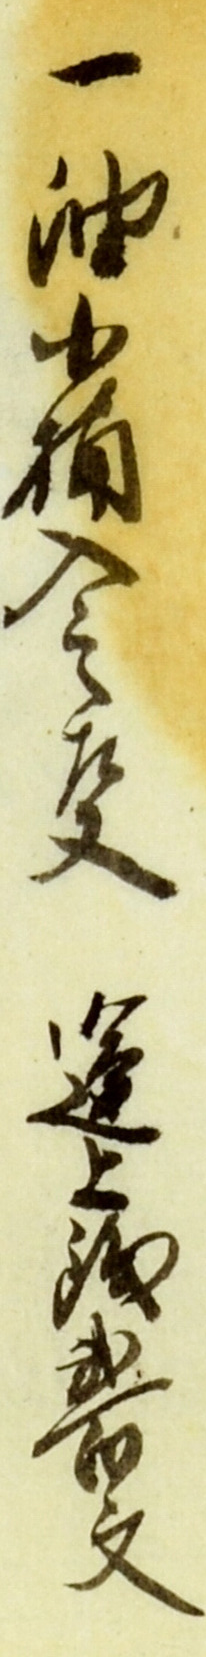一油小箱入之事運上銭弐百文
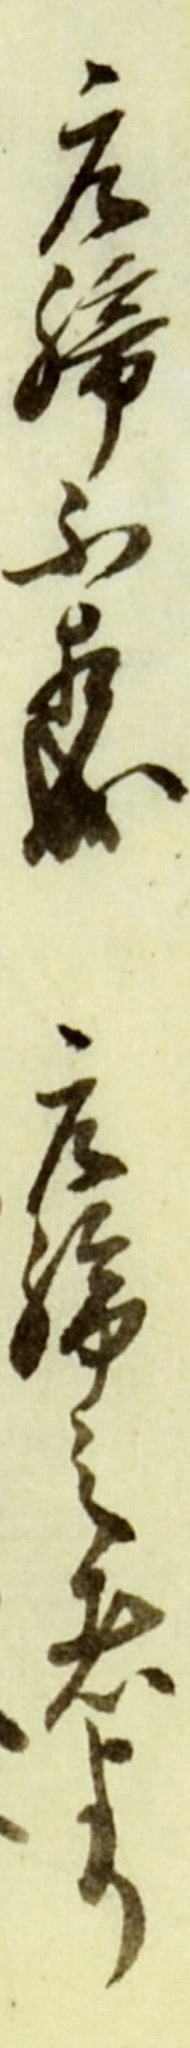元締不相成元締之者より
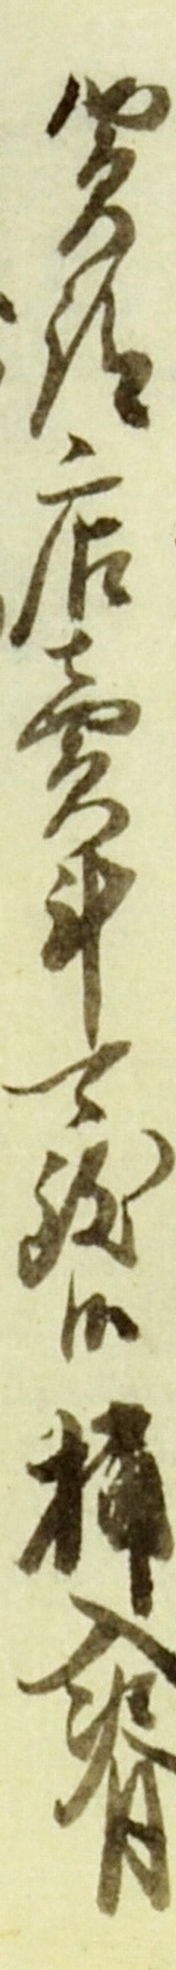買請店売斗可致候桶入背
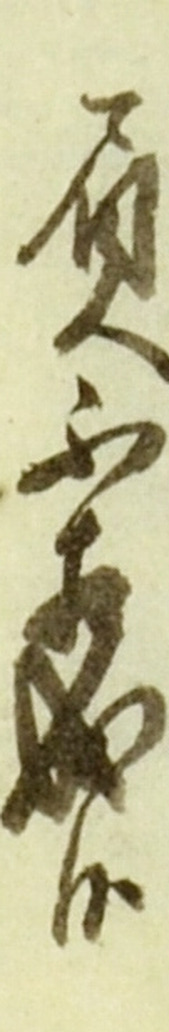負不相成候
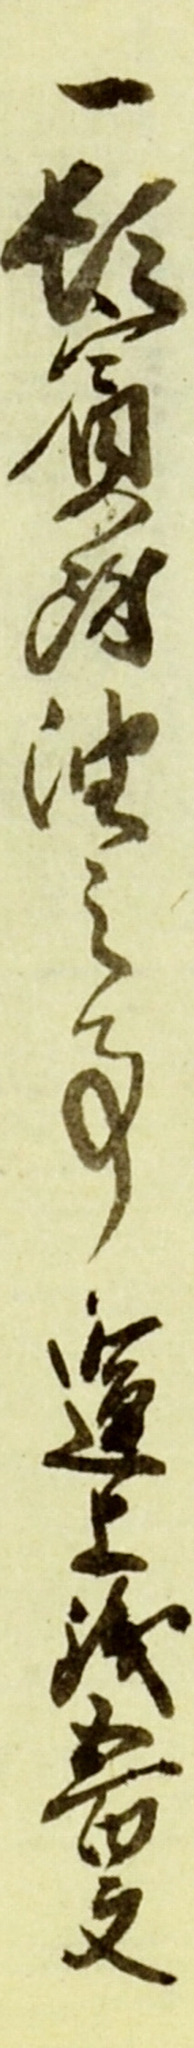一鬢附油之事運上銭五百文
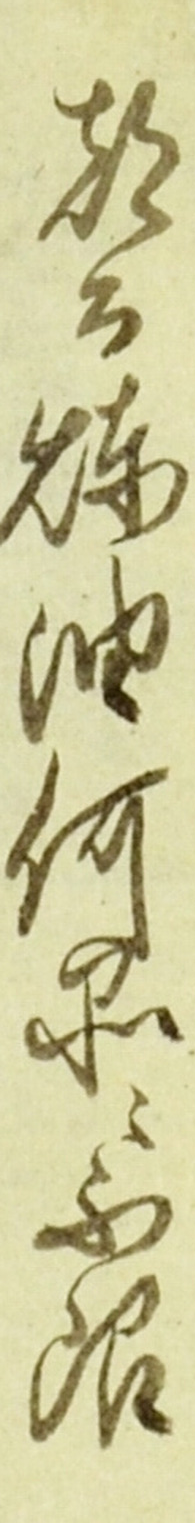都而煉油何品ニ不限
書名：分一方諸運上御定法
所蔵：伊那市立高遠町図書館・合同会社AMANE
